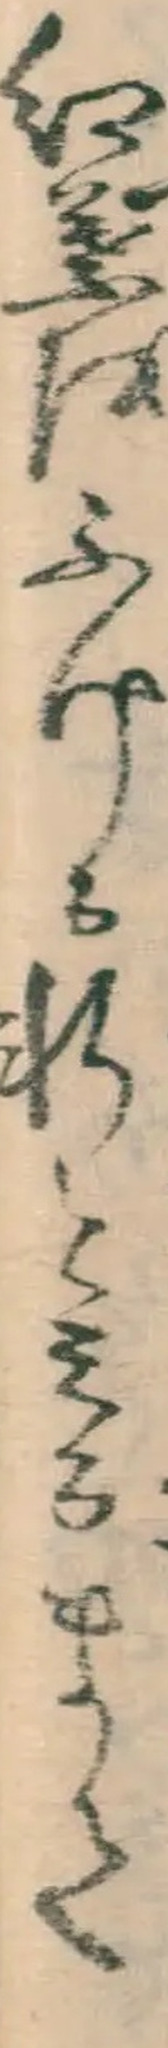紅葉をふけも軒とみるまて定基
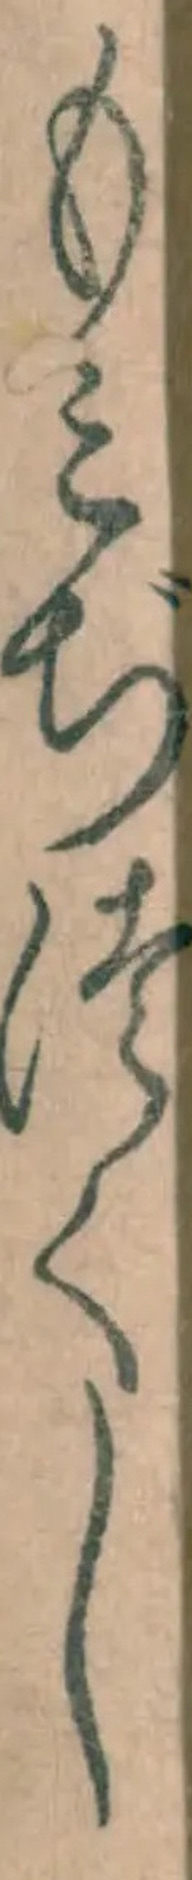もみぢつくし
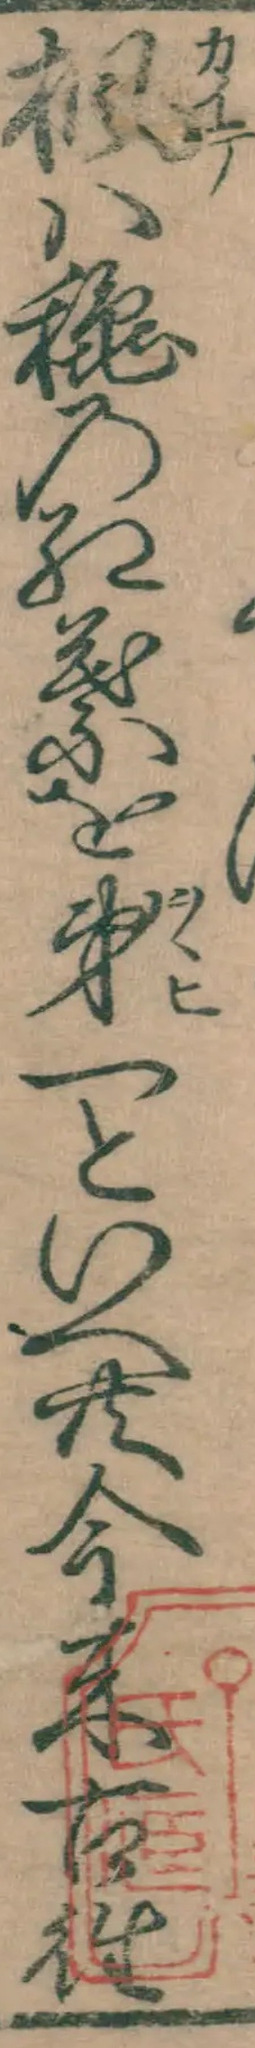楓は穐の紅葉を第一といへ共今来古往
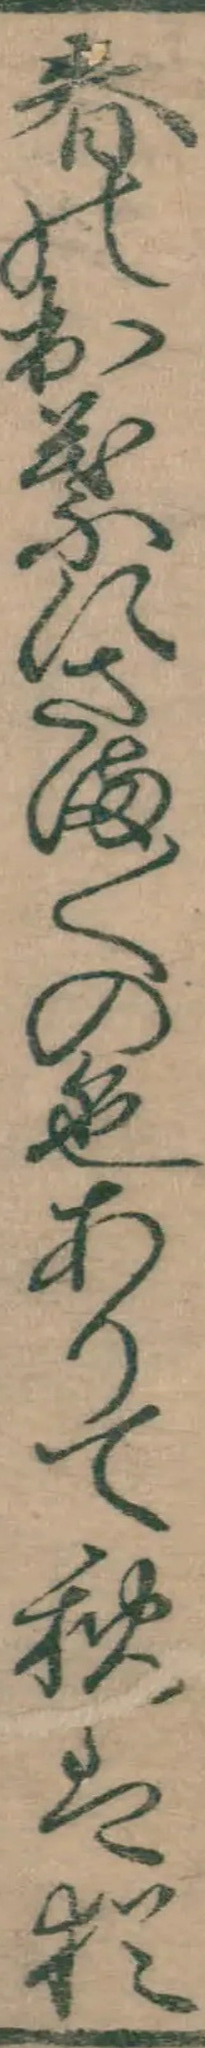春の出葉にさま〳〵の色ありて秋は猶
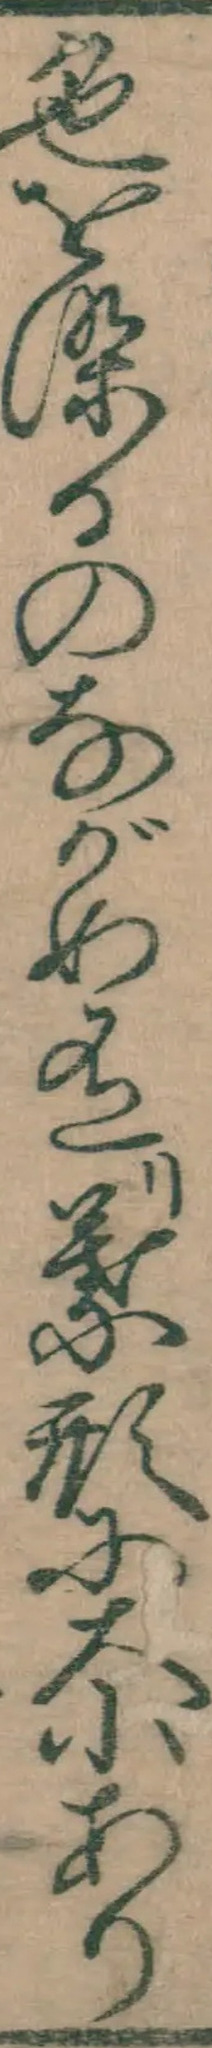色を染るのながめ有葉形に大小あり
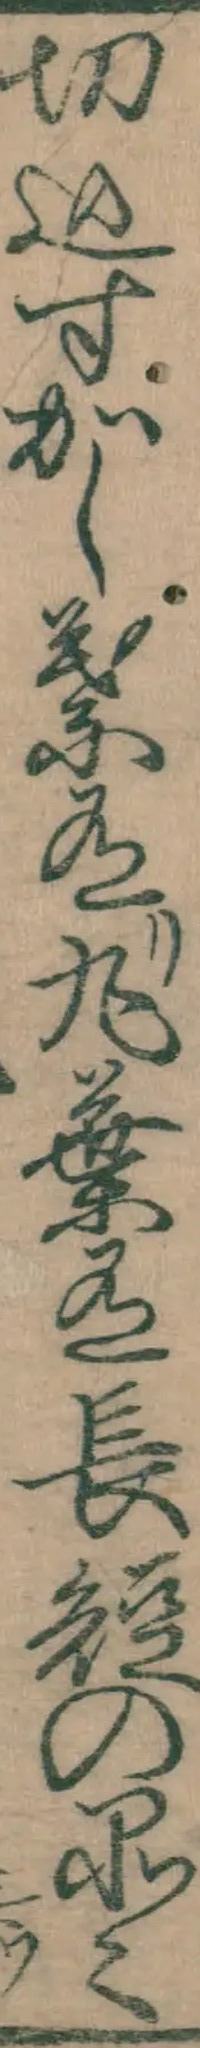切込すかし葉有丸葉有長短の品々
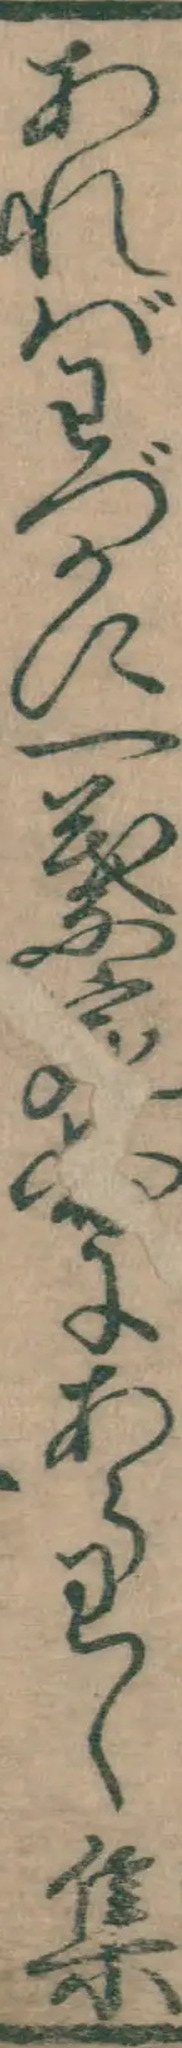あればわづかに一葉宛図にあらわし集
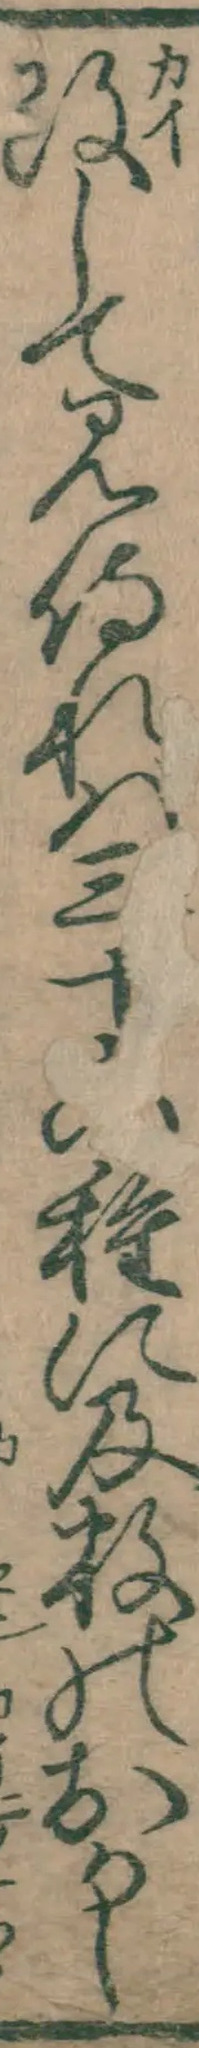改して見侍れば三十六種に及数のおかし
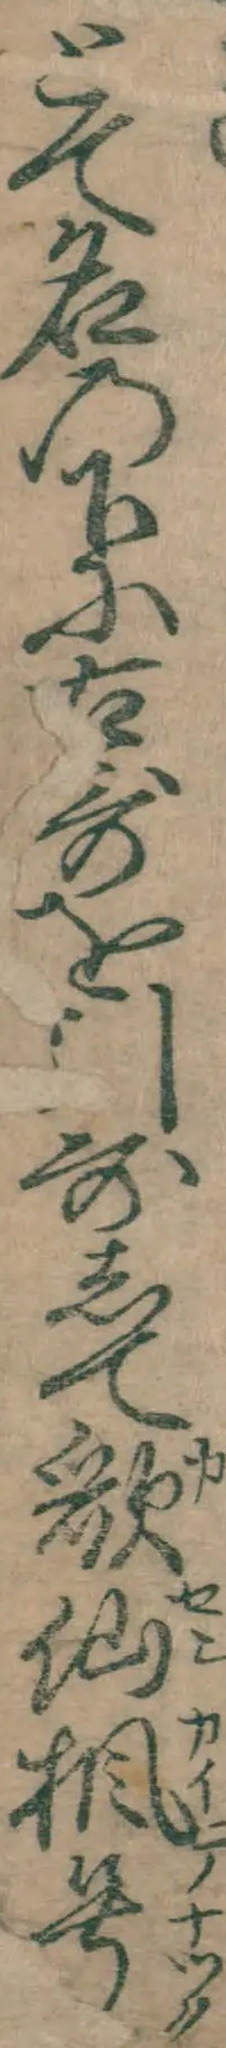とて名の下に古哥を引哥して歌仙楓号

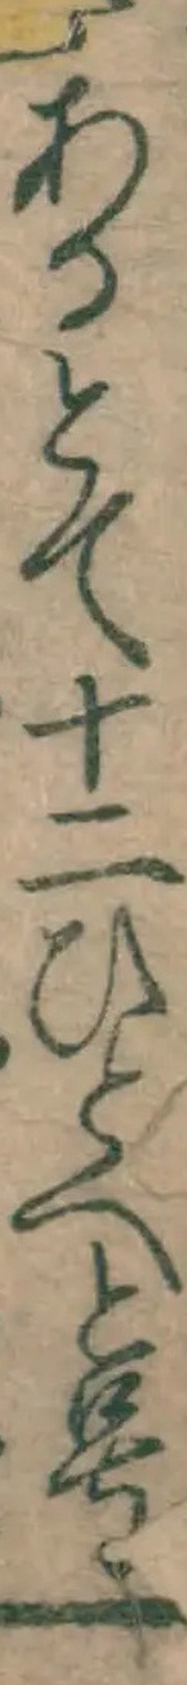あるとて十二ひとへと号
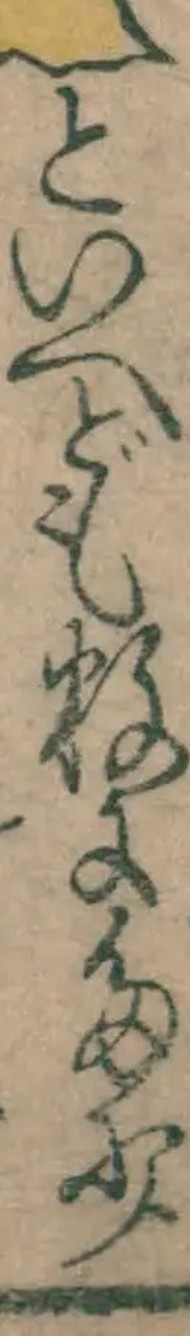といへども数に多少
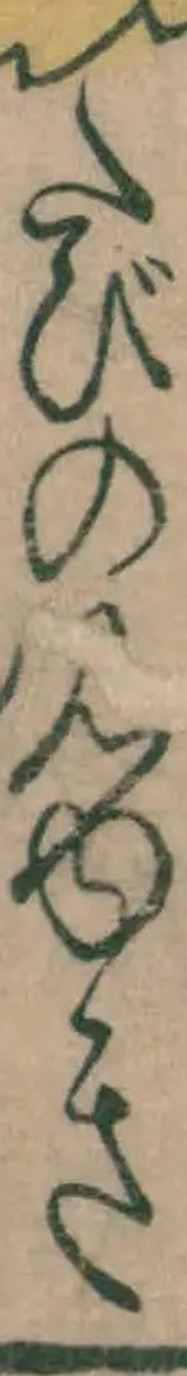葉たびのみゆき
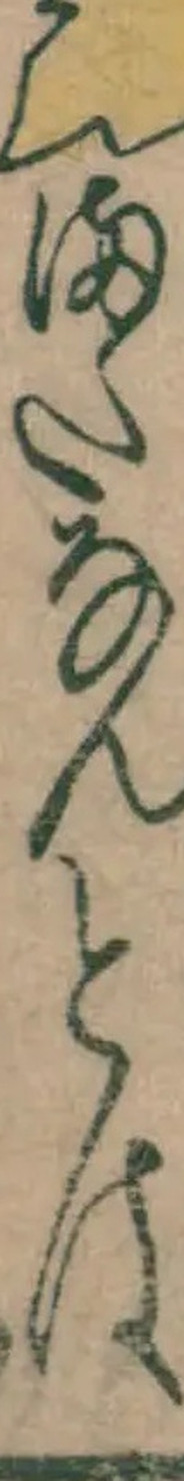またなんとは
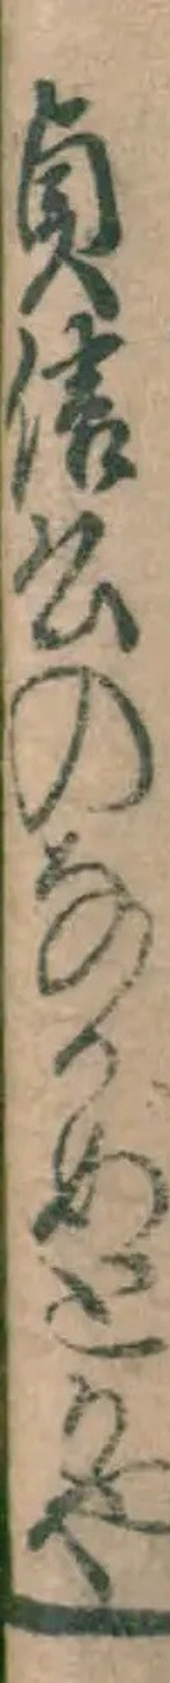貞信公のなかめとかや
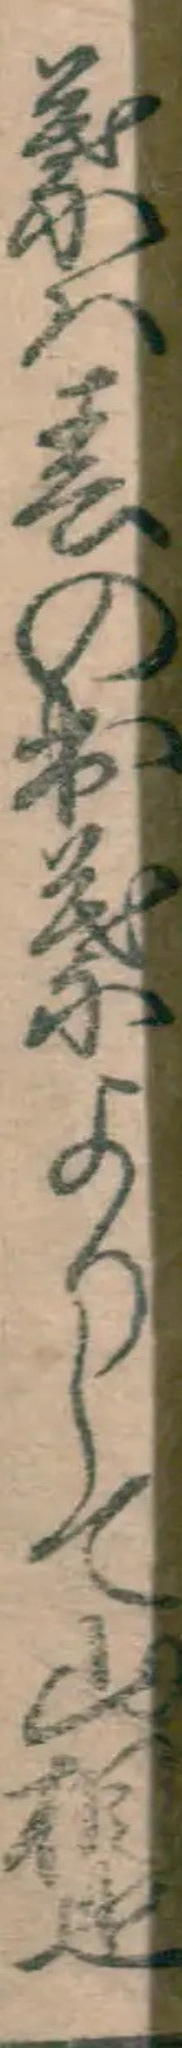高雄葉は春の出葉よりして山楓也
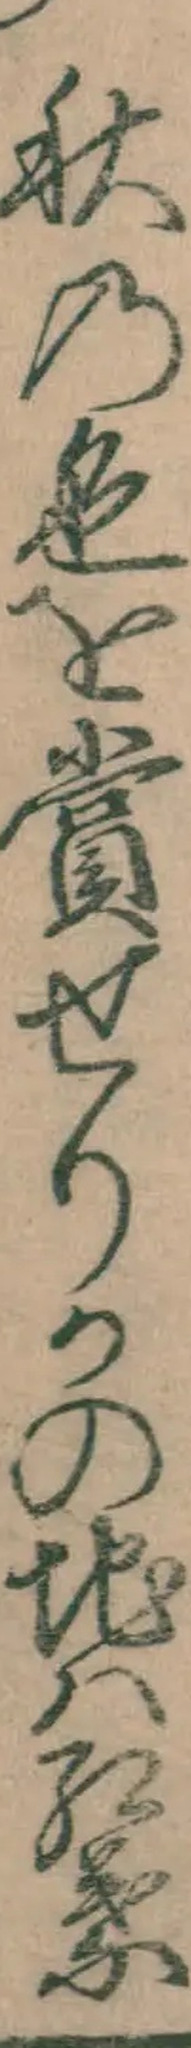秋の色を賞せりかの地は紅葉
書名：紅葉集
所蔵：国立国会図書館 National Diet Library, JAPAN
